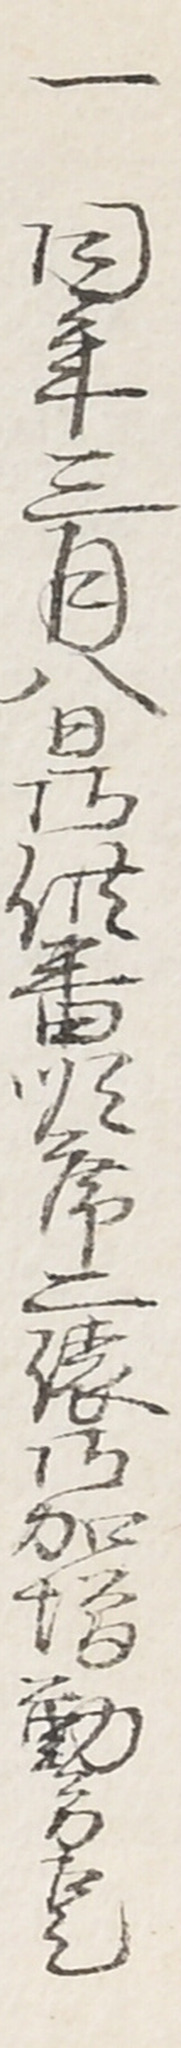一同年三月八日御供番順席二俵御加増勤方是
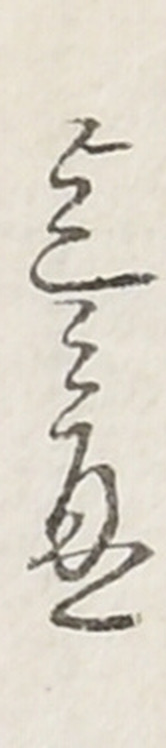迄之通
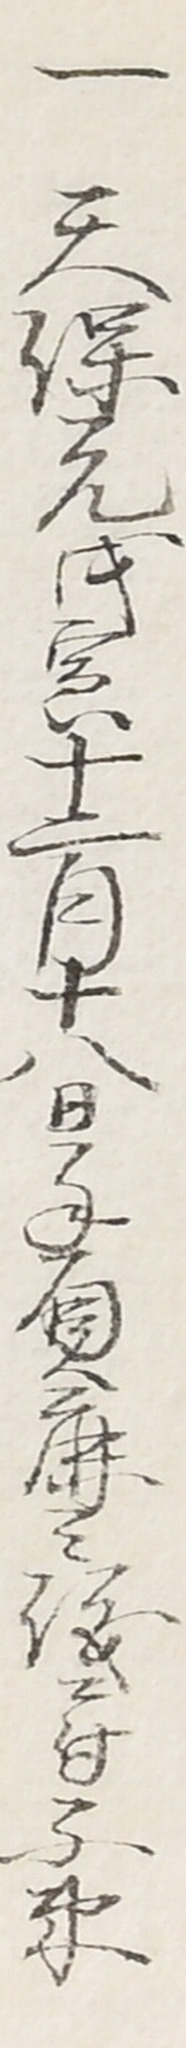一天保元戊寅十二月十八日手負鹿之儀ニ付不束
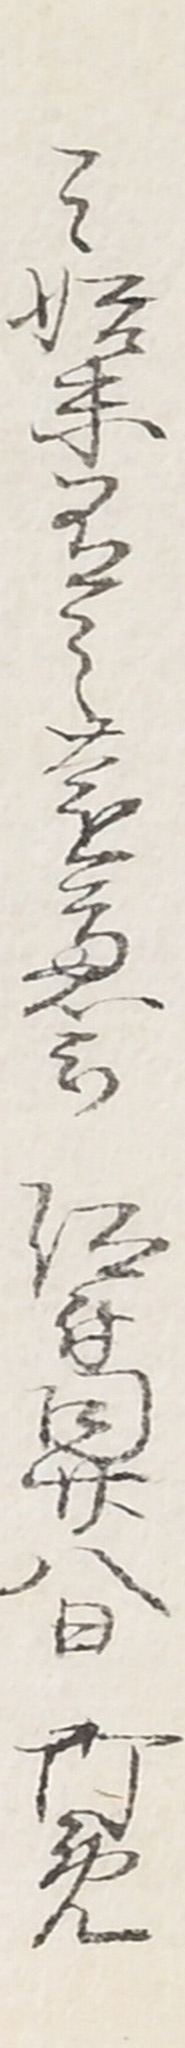之始末有之遠慮被仰付同廿八日御免
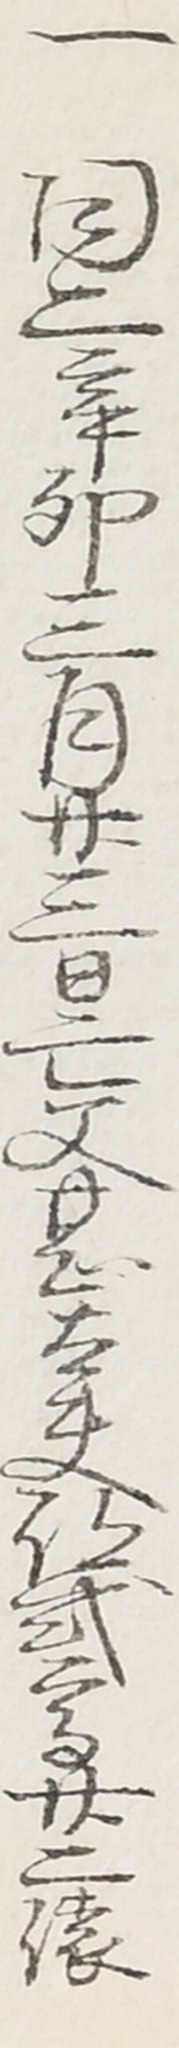一同二辛卯三月廿三日亡父甚太夫跡式高廿二俵
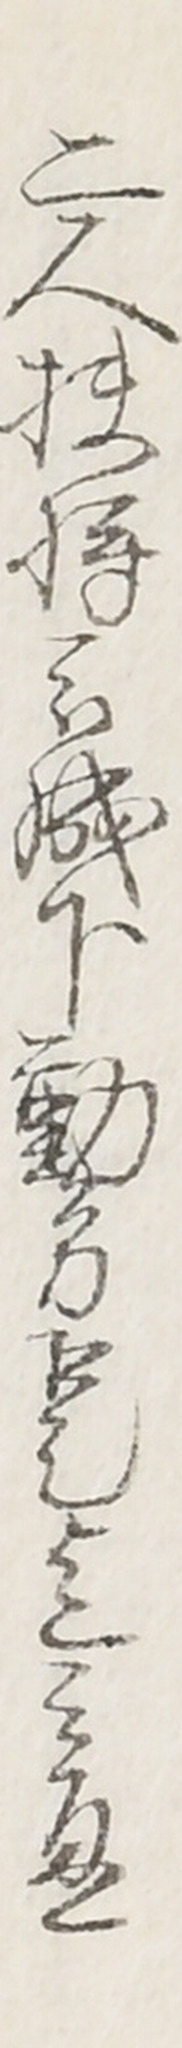二人扶持被成下勤方是迄之通
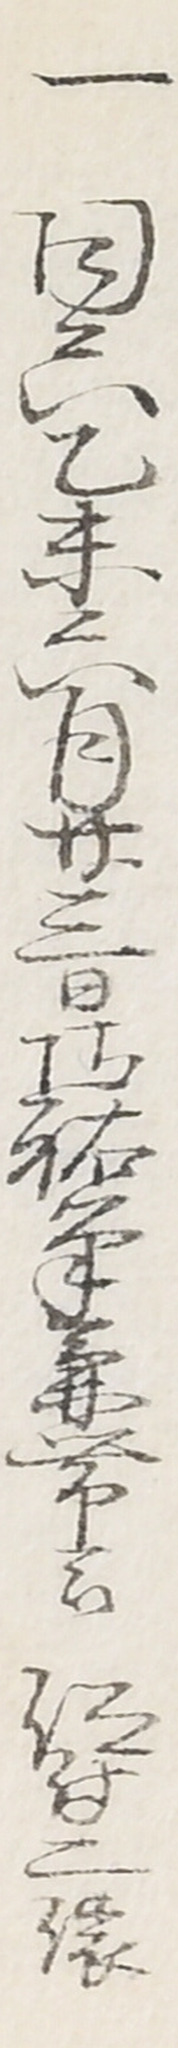一同六乙未六月廿三日御祐筆兼帯被仰付二俵
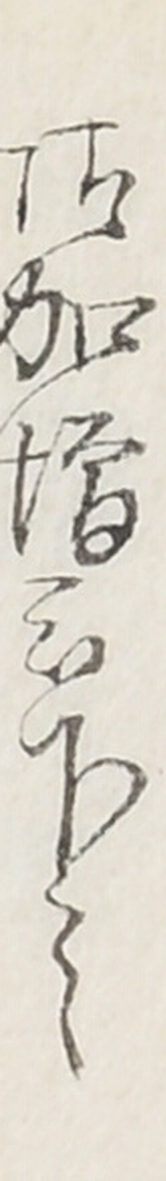御加増被下之
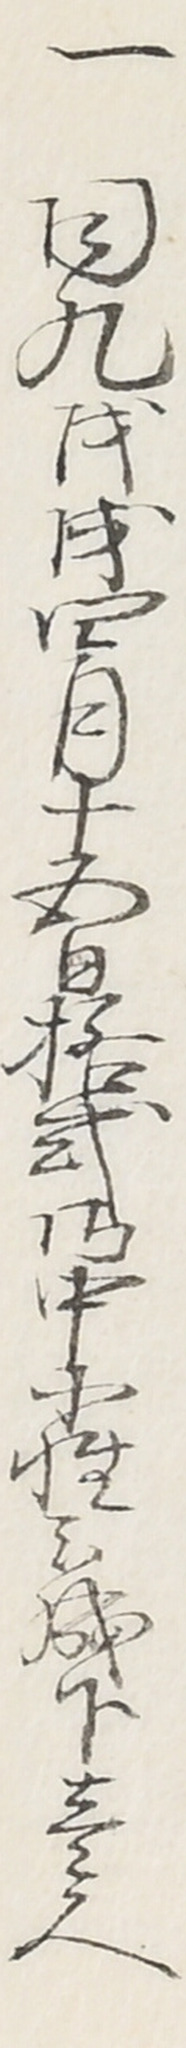一同九戊戌四月十五日格式御中小性被成下壱人
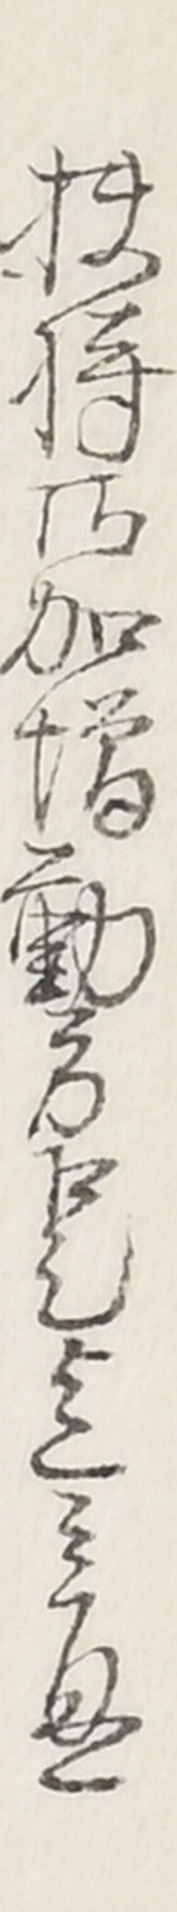扶持御加増勤方是迄之通
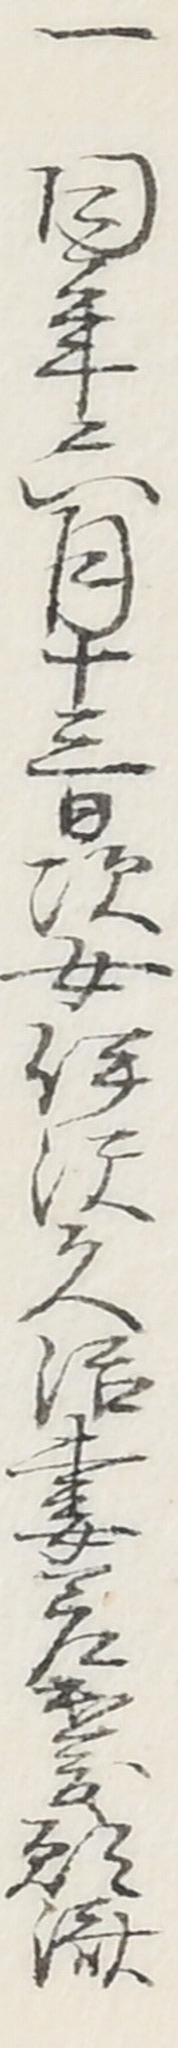一同年六月十三日次女伊沢久治妻差遣度願済
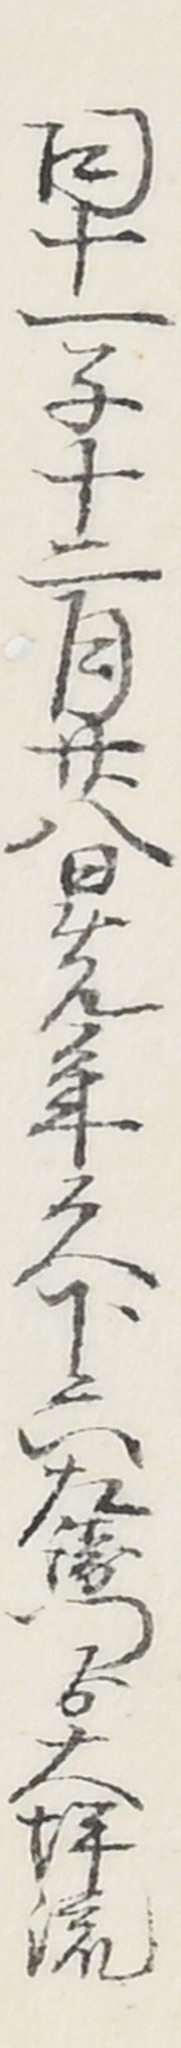一同十一子十二月廿八日先年久下六左衛門ゟ大坪流
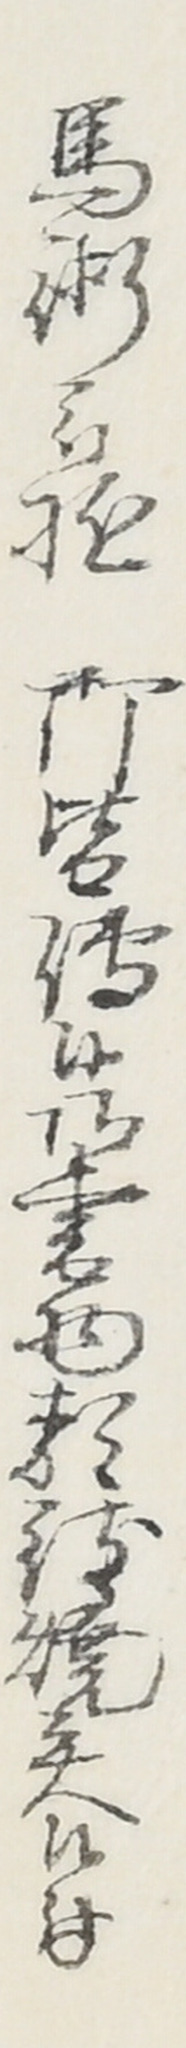馬術被遊御皆伝候御書物類致焼失候付
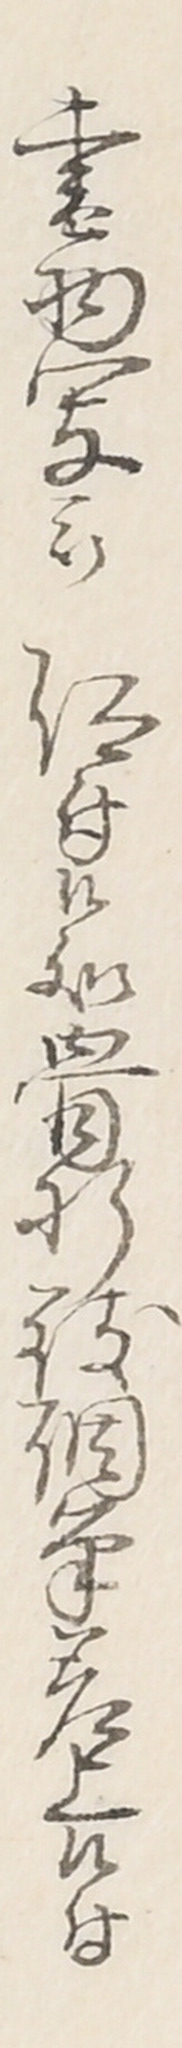書物写被仰付候処骨折致調筆差上候付
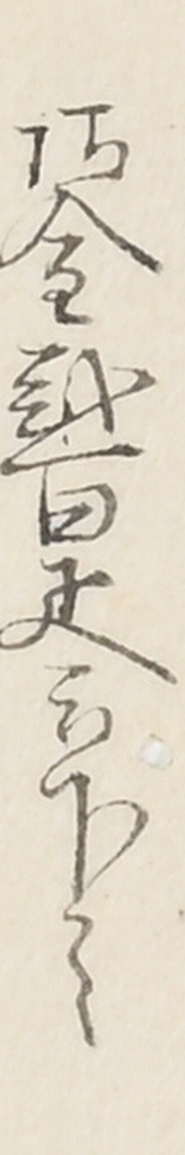御金弐百疋被下之
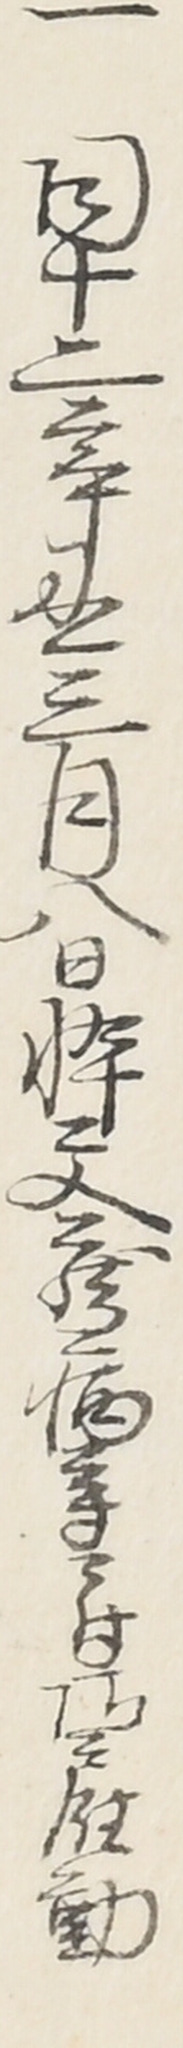一同十二辛丑三月八日忰文蔵病気ニ付御雇勤
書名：無足諸士勤仕録（四）
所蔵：伊那市立高遠町図書館・合同会社AMANE
